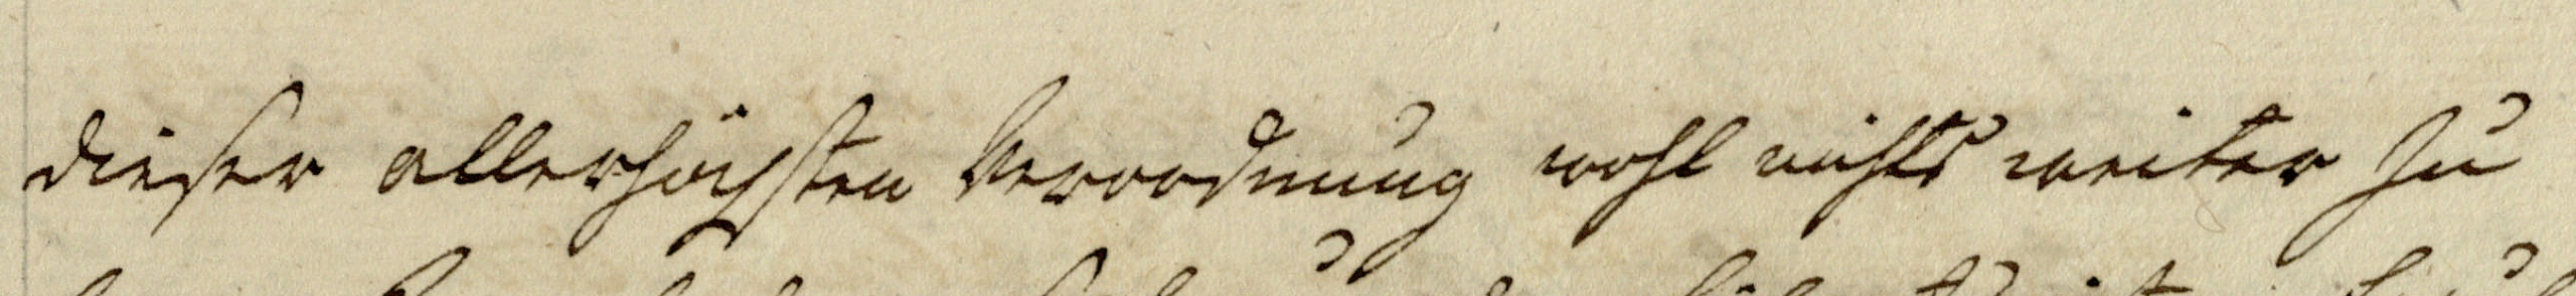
dieser allerhöchsten Verordnung wohl nichts weiter zu
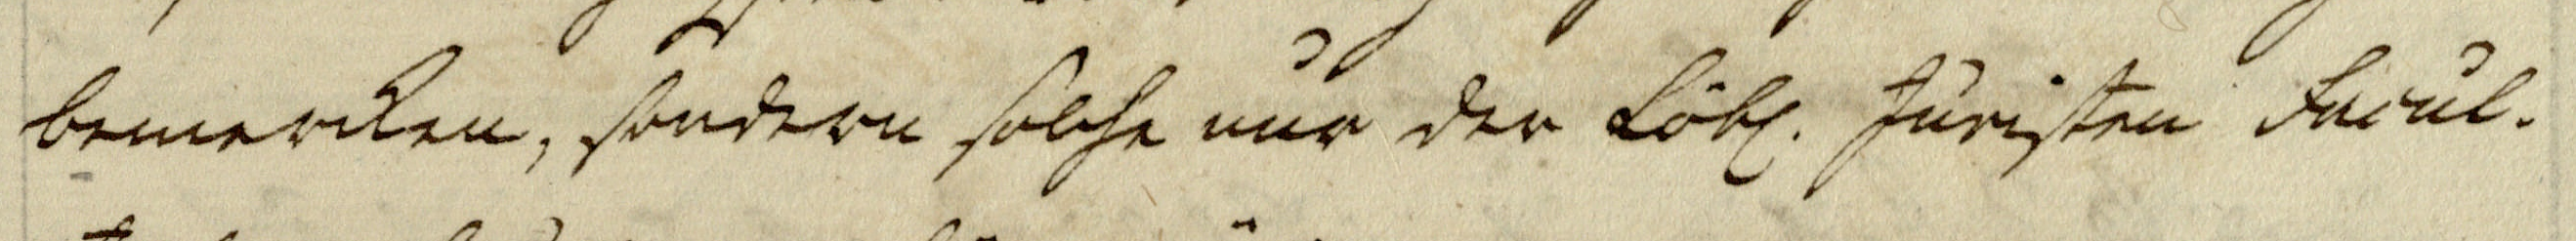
bemercken, sondern solche nur der Löbl. Juristen Facul¬
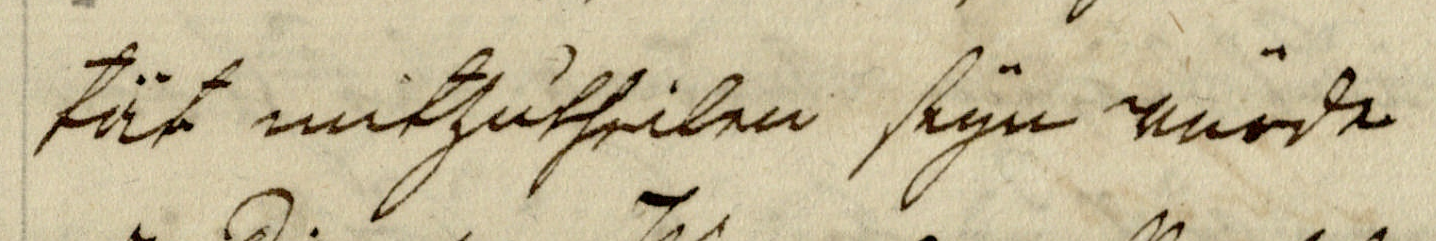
tät mitzutheilen seÿn würde.
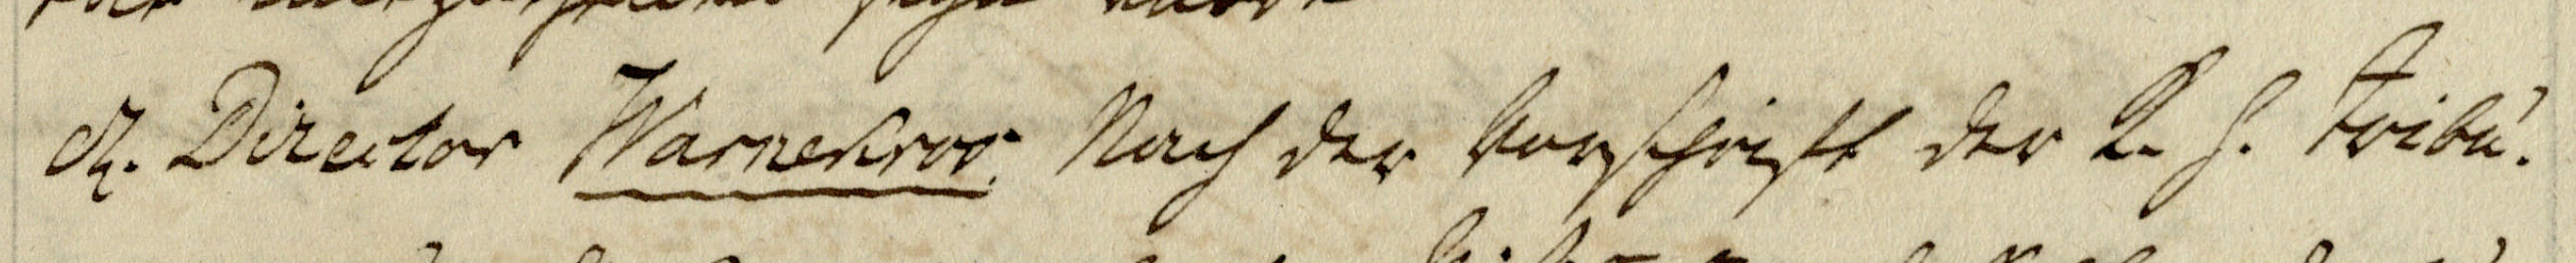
dh. Director Warnekros. Nach der Vorschrift der K. h. Tribu¬
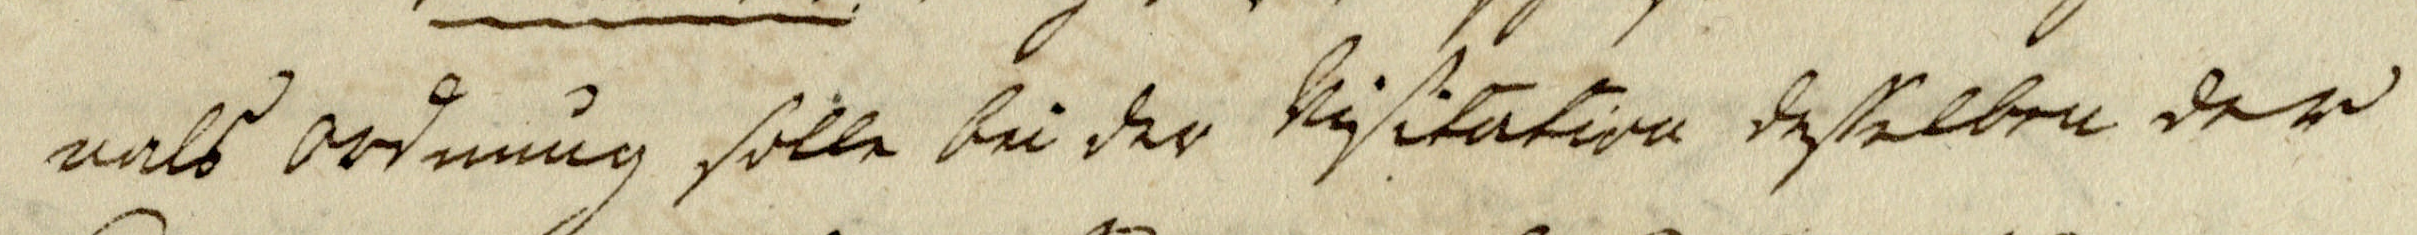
nals Ordnung solle bei der Visitation desselben der
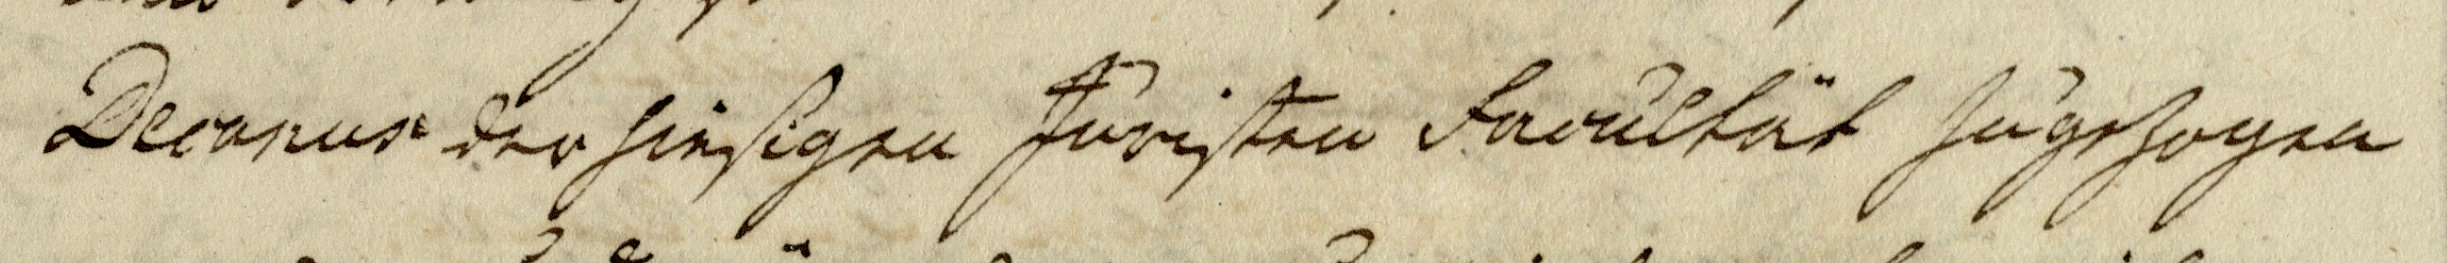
Decanus der hiesigen Juristen Facultät zugezogen
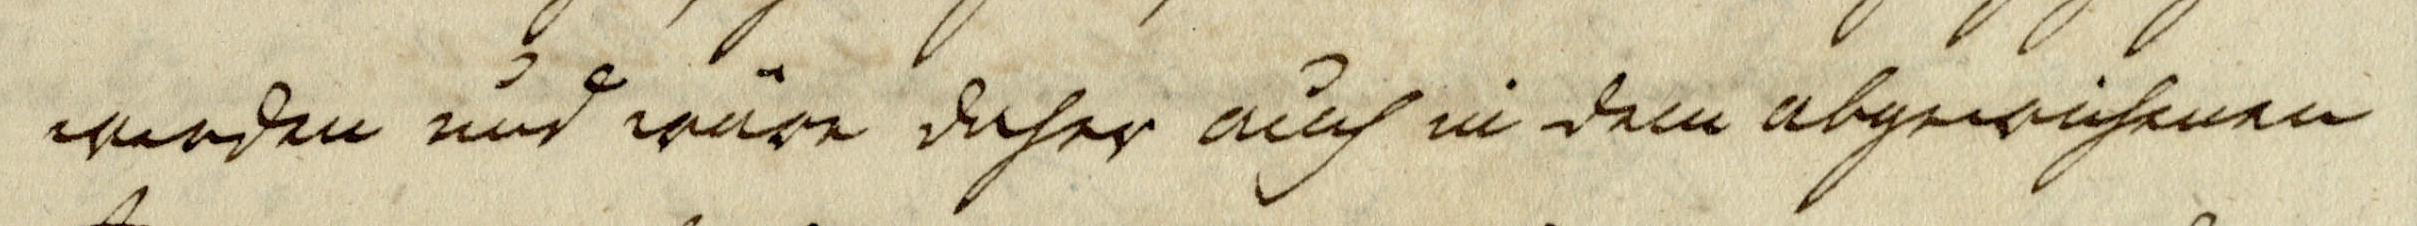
werden und wäre daher auch in dem abgewichenen
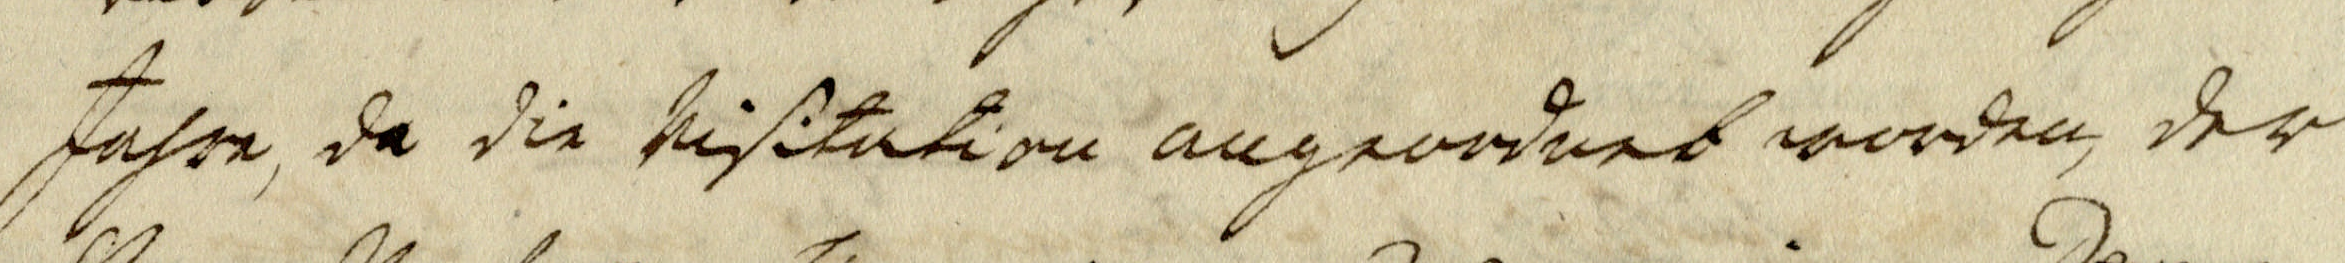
Jahre, da die Visitation angeordnet worden, der
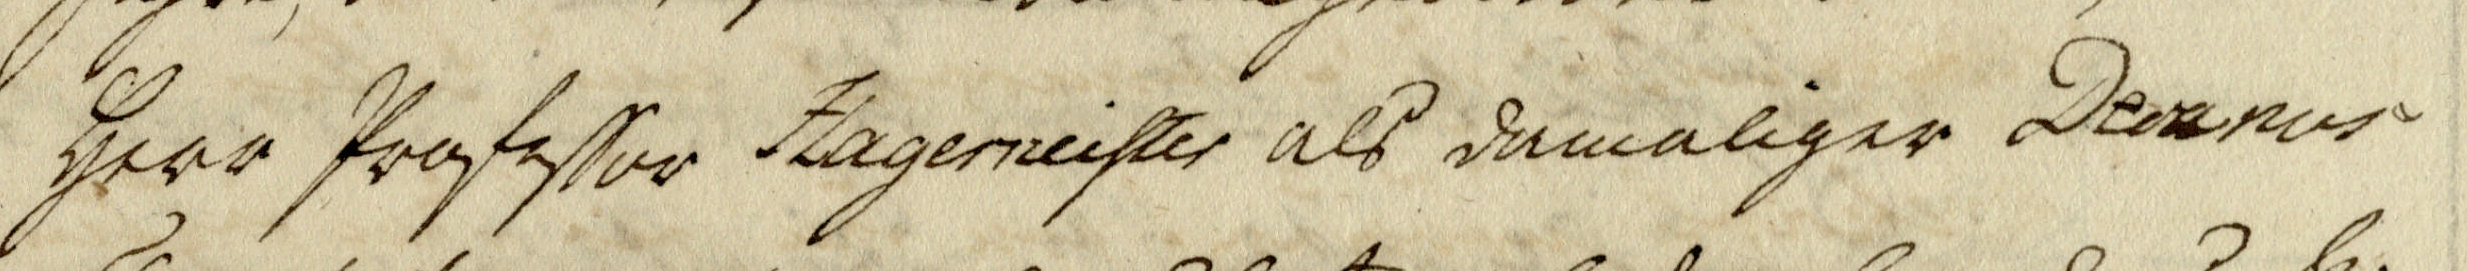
Herr Professor Hagemeister als damaliger Decanus
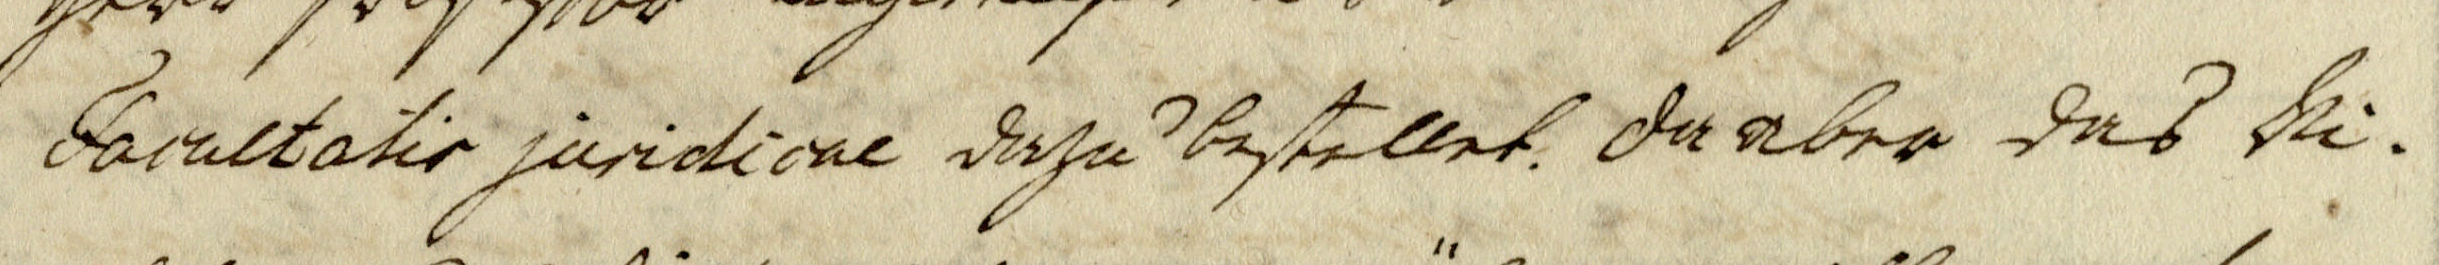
Facultatis juridicae dazu bestelle. Da aber das Vi¬
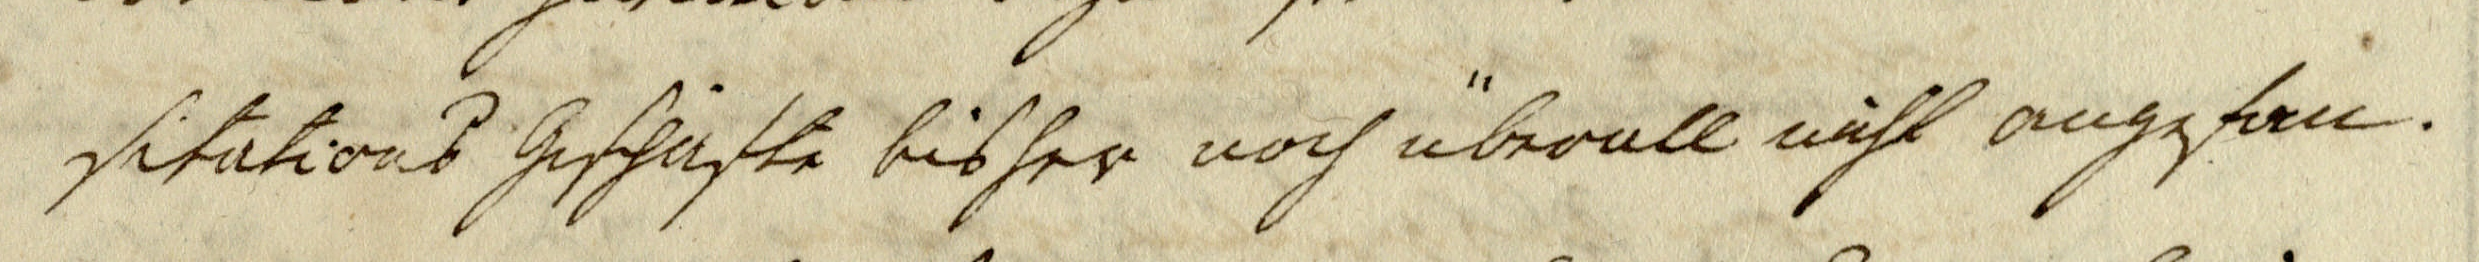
sitations Geschäfte bisher noch überall nicht angefan¬
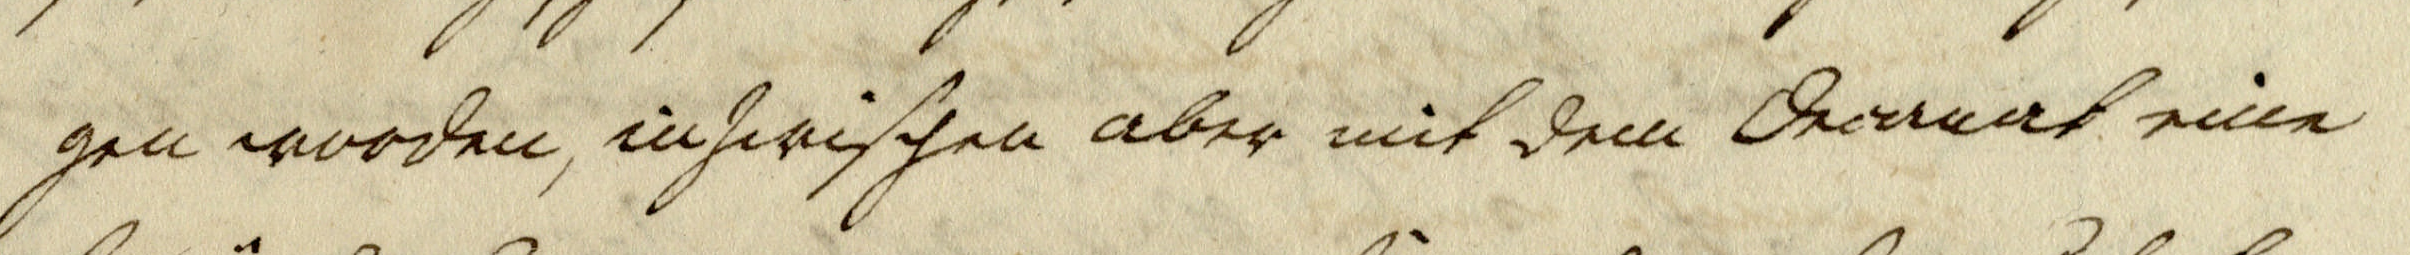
gen worden, inzwischen aber mit dem Decanat eine
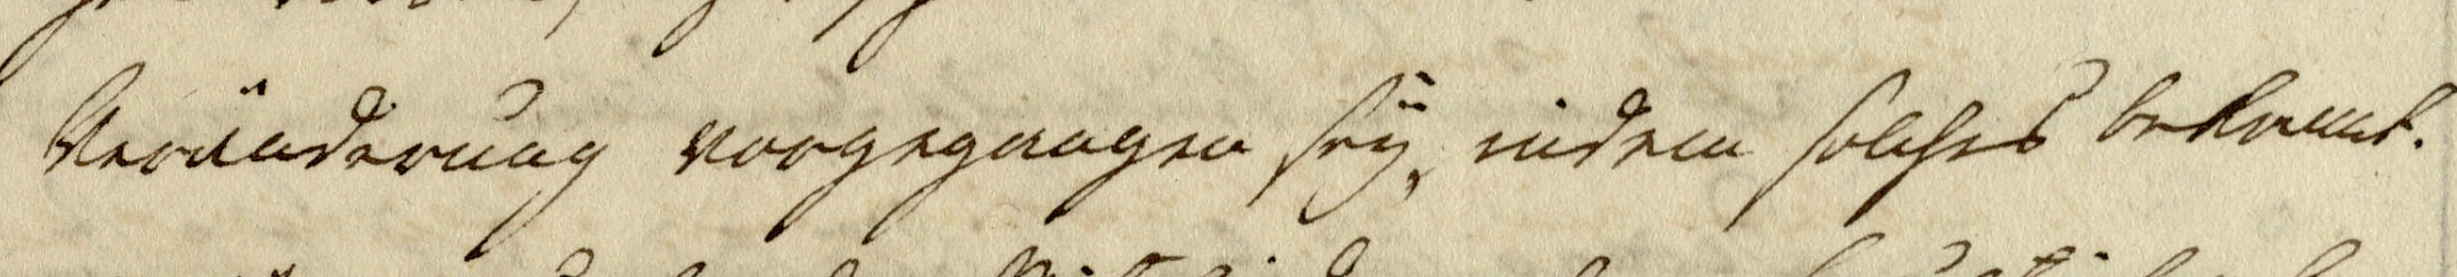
Veränderung vorgegangen seÿ, indem solches bekannt¬
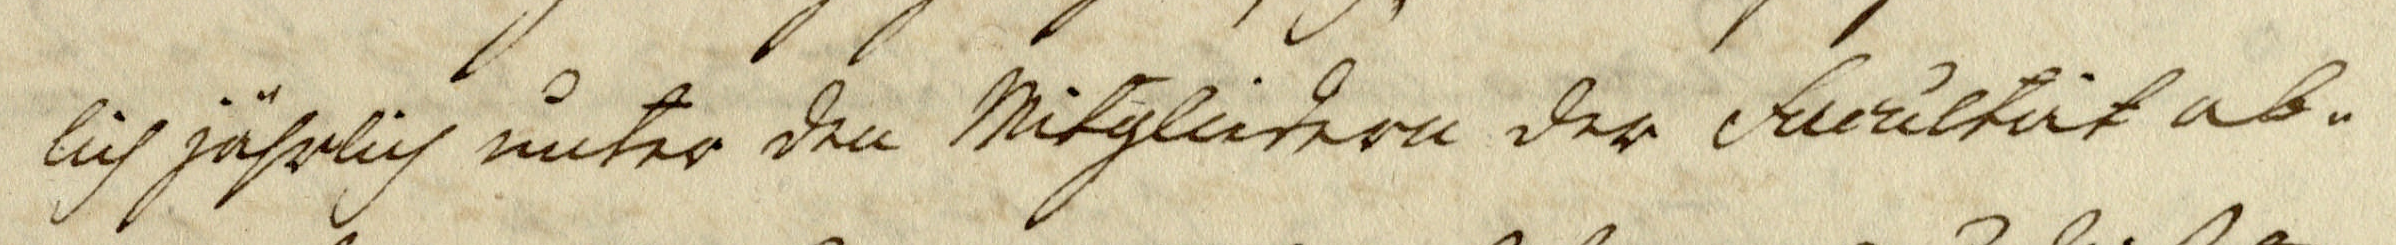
lich jährlich unter den Mitgliedern der Facultät ab¬
